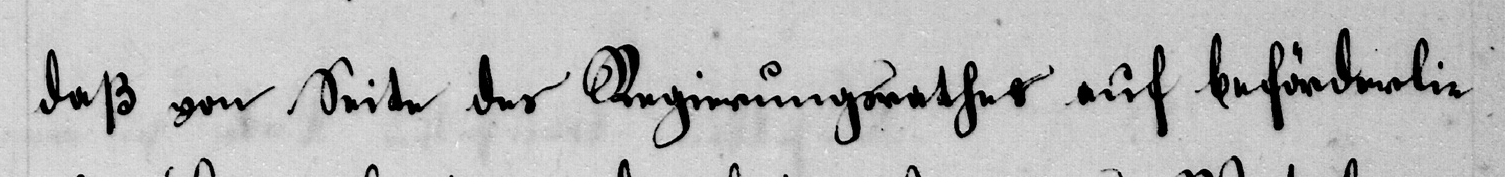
daß von Seite des Regierungsrathes auf beförderli¬
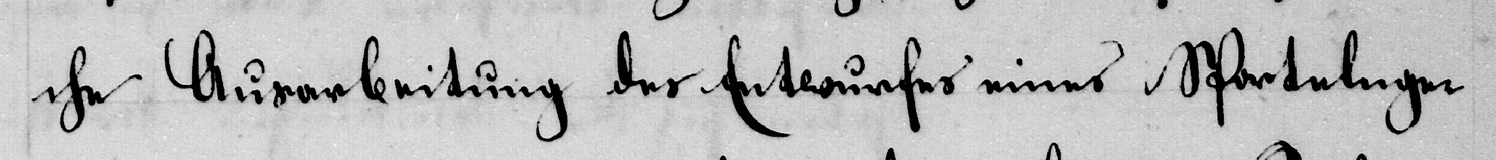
che Ausarbeitung des Entwurfes eines Sportelnge¬
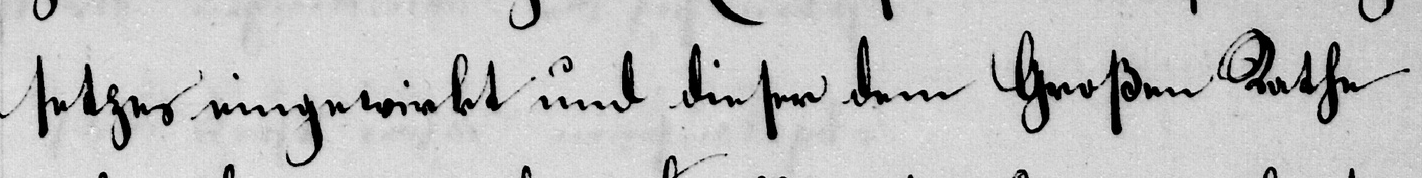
setzes eingewirkt und dieser dem Großen Rathe
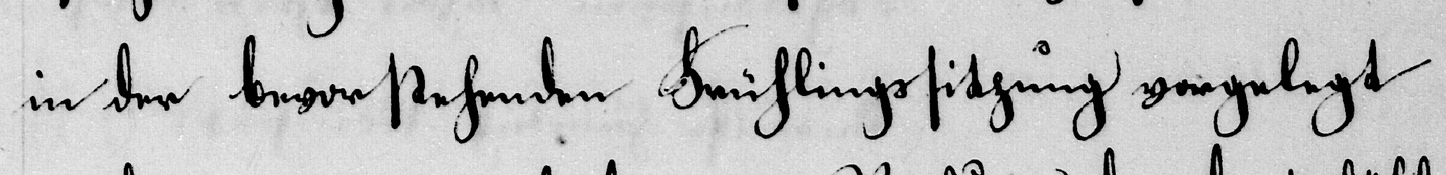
in der bevorstehenden Frühlingssitzung vorgelegt
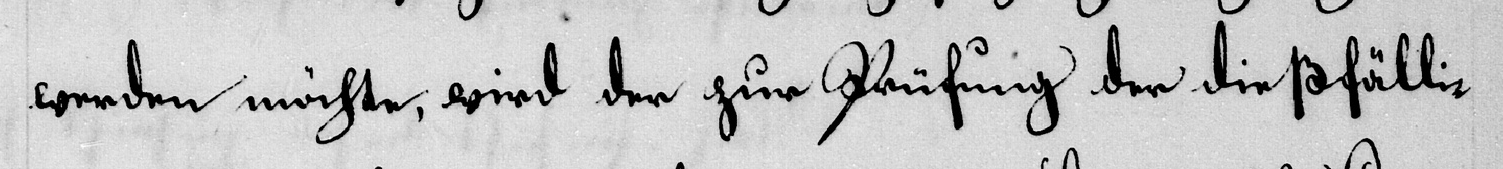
werden möchte, wird der zur Prüfung der dießfälli¬
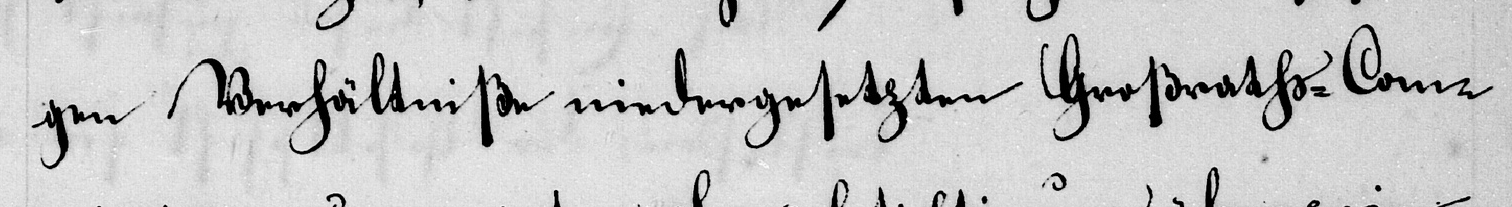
gen Verhältniße niedergesetzten Großraths-Com¬
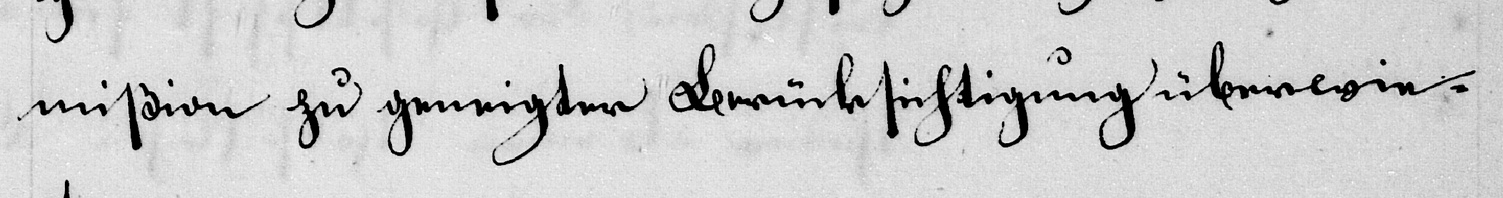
mißion zu geeigneter Berücksichtigung überwie¬
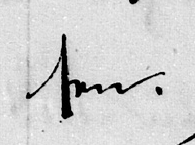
sen.
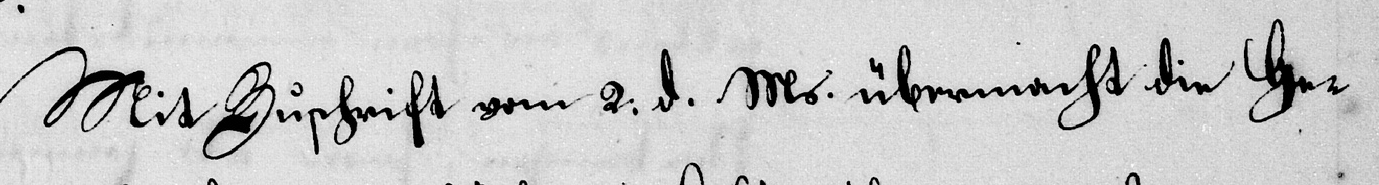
Mit Zuschrift vom 2. d. Ms. übermacht die Ge¬
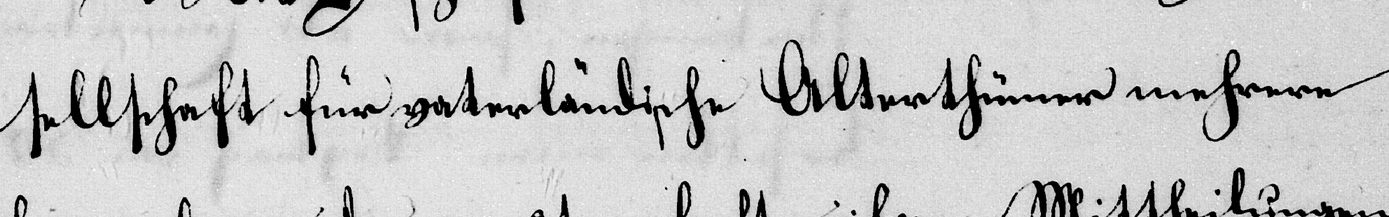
sellschaft für vaterländische Alterthümer mehrere
